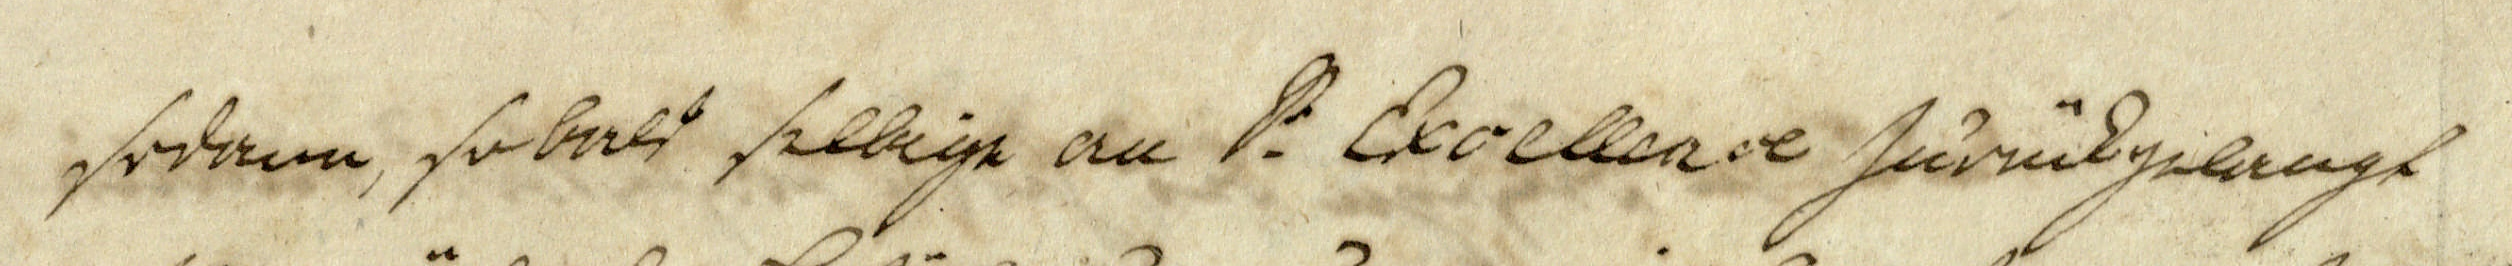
sodann, sobald selbige an Sr Excellence zurückgelangt
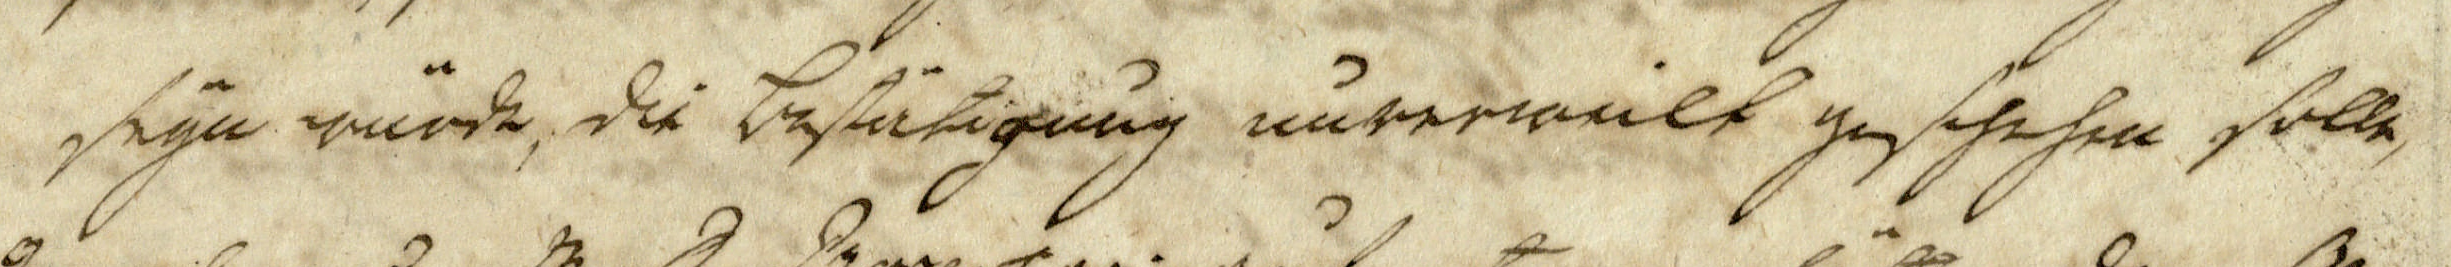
seÿn würde, die Bestätigung unverweilt geschehen sollte,
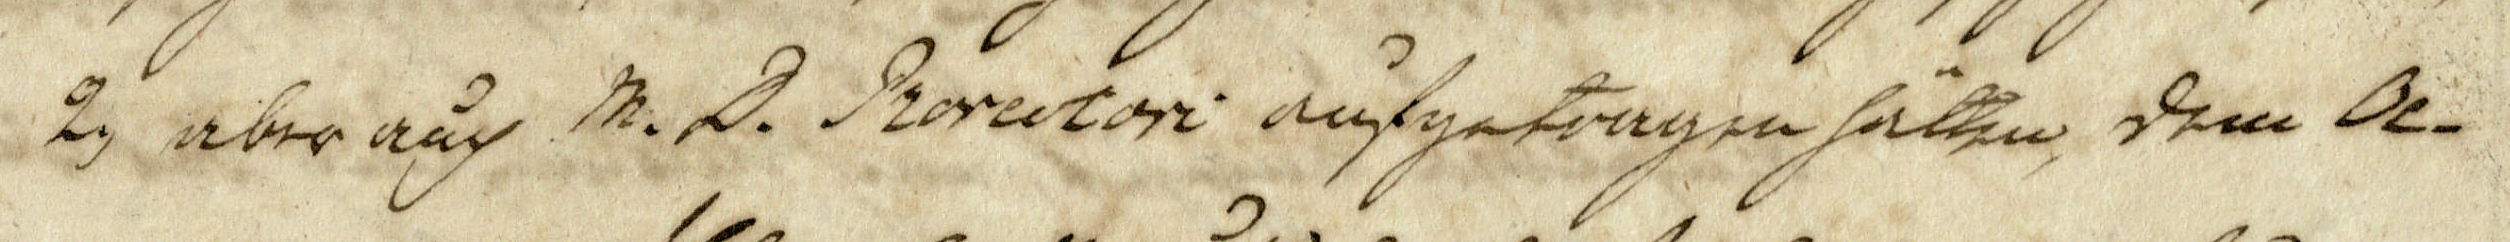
2., aber auch M. D. Prorectori aufgetragen hätten dem Oe¬
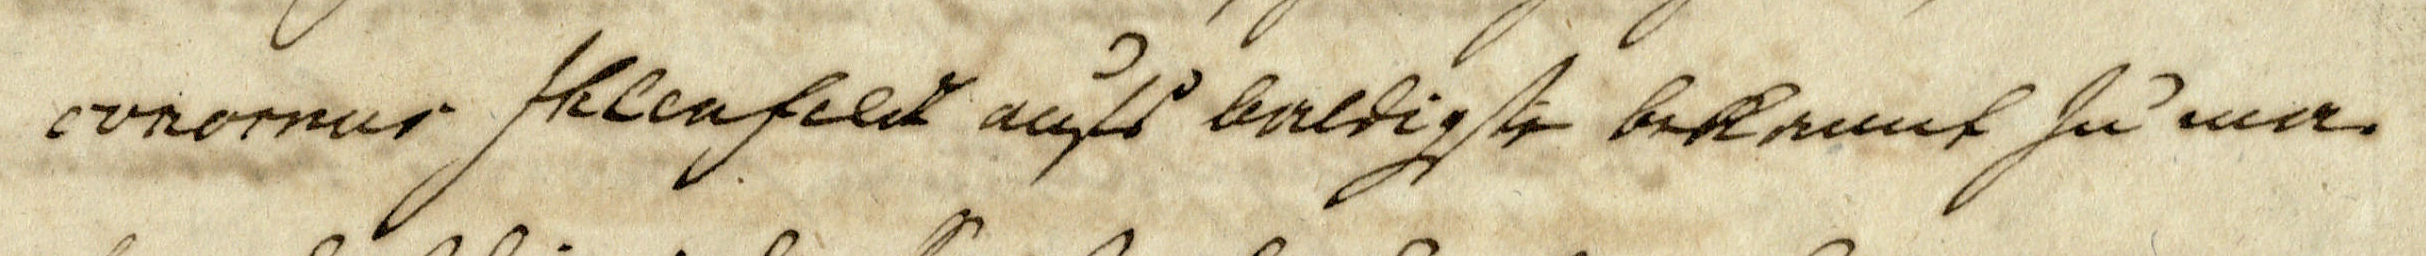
conomus Ihlenfeldt aufs baldigste bekannt zu ma¬
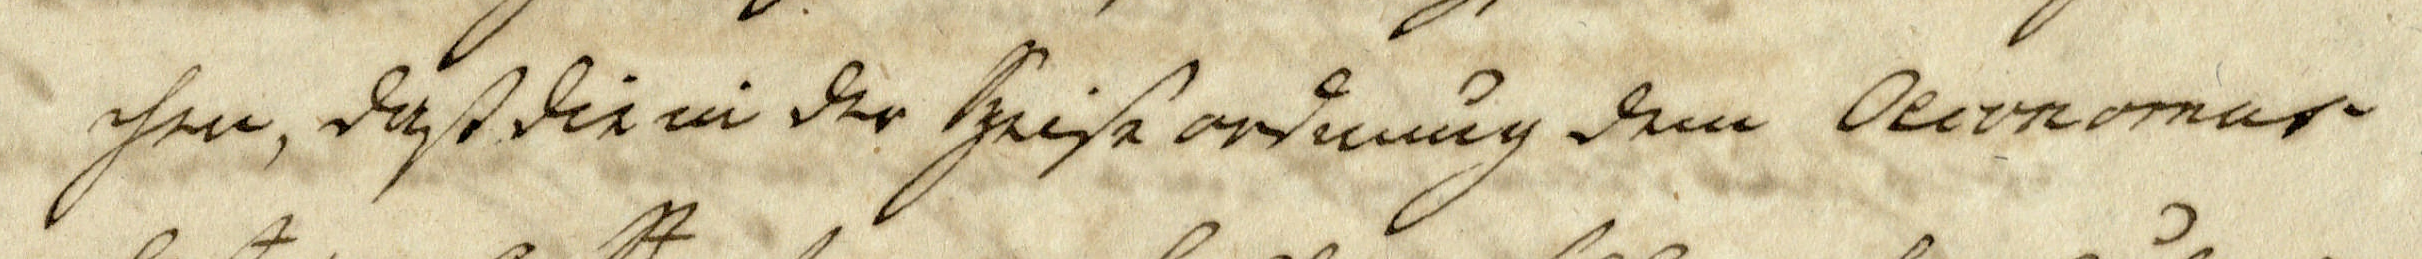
chen, daß die in der Speiseordnung dem Oeconomus
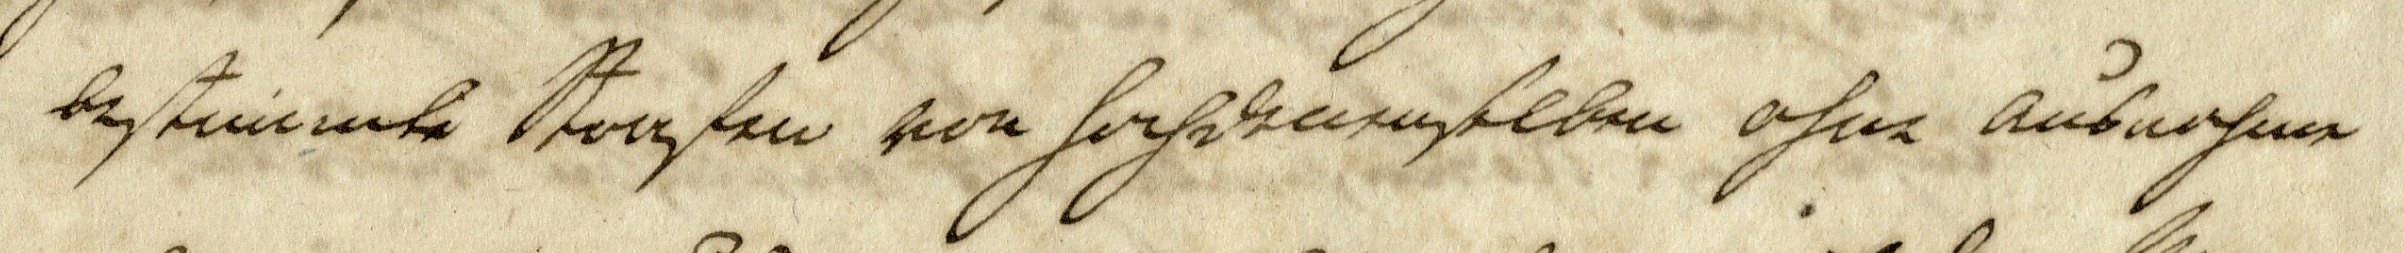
bestimmte Strafen von Hochdenenselben ohne Ausnahme
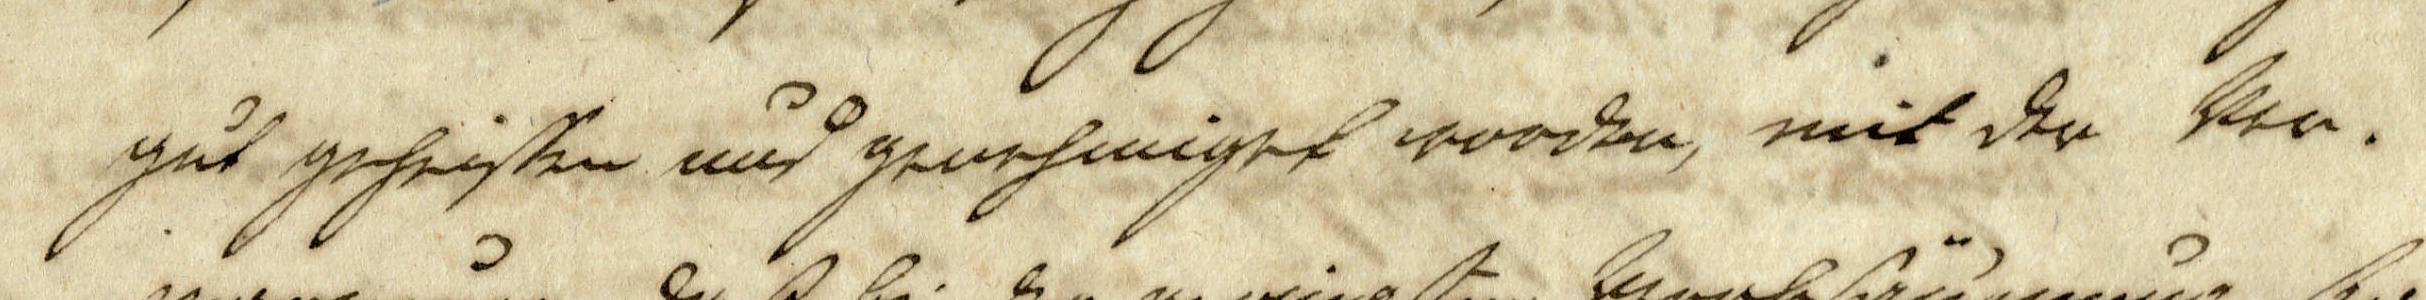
gut geheissen und genehmiget worden, mit der Ver¬
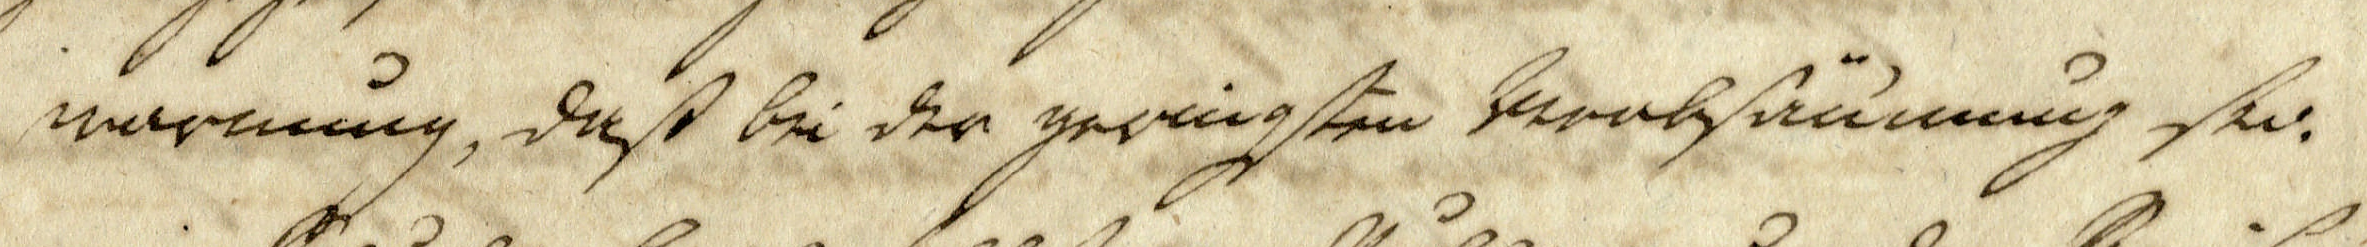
warnung, daß bei der geringsten Verabsäumung sein¬
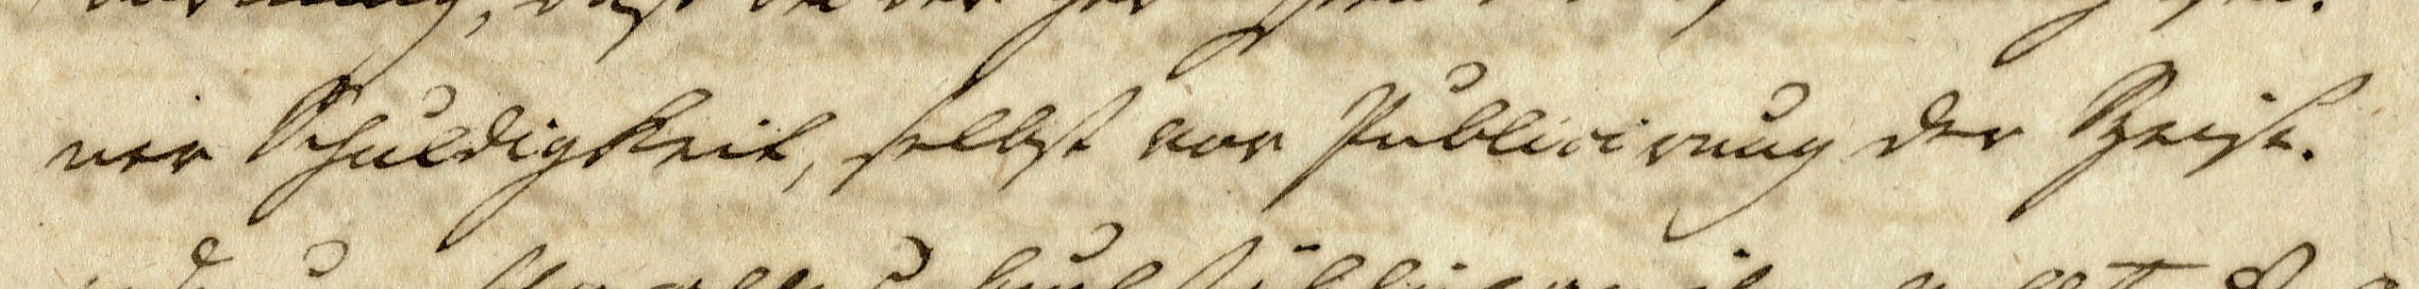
ner Schuldigkeit, selbst vor Publicirung der Speise¬
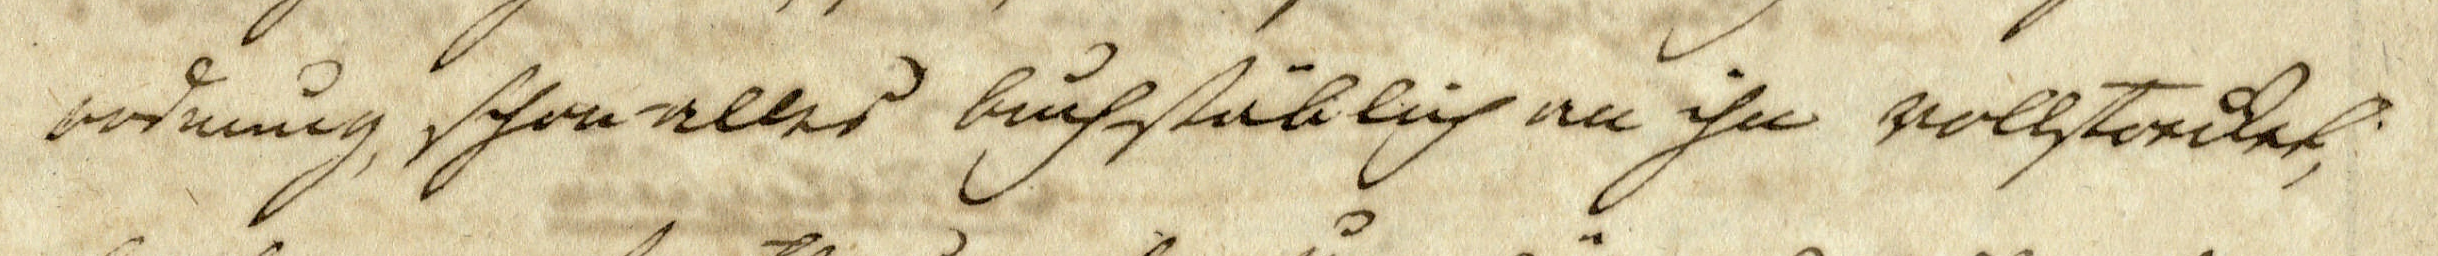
ordnung, schon alles buchstäblich an ihn vollstrecket;
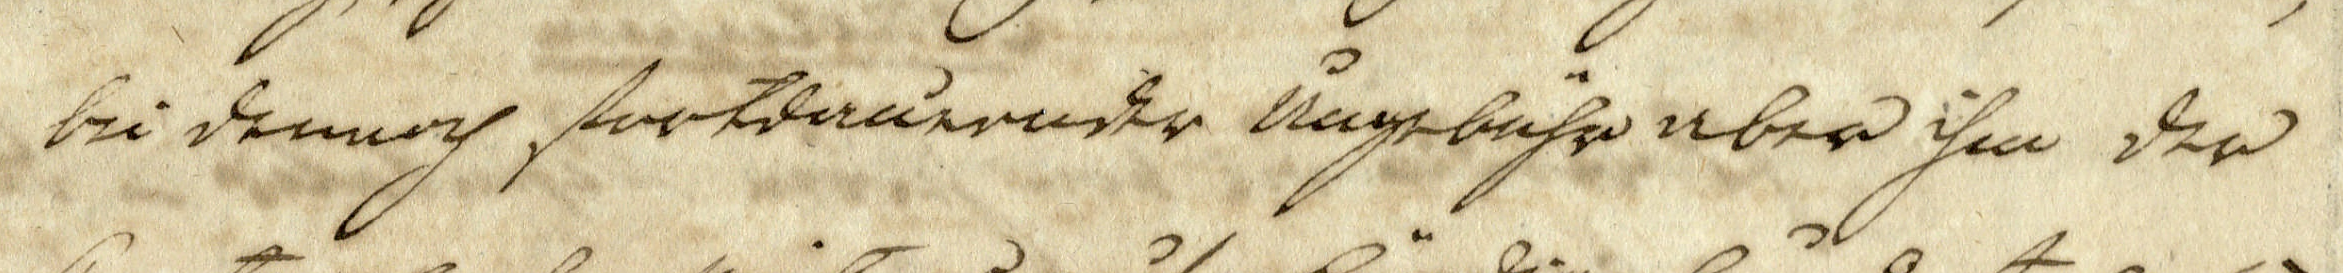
bei dennoch sinrtdauernder Ungebühr aber ihm der
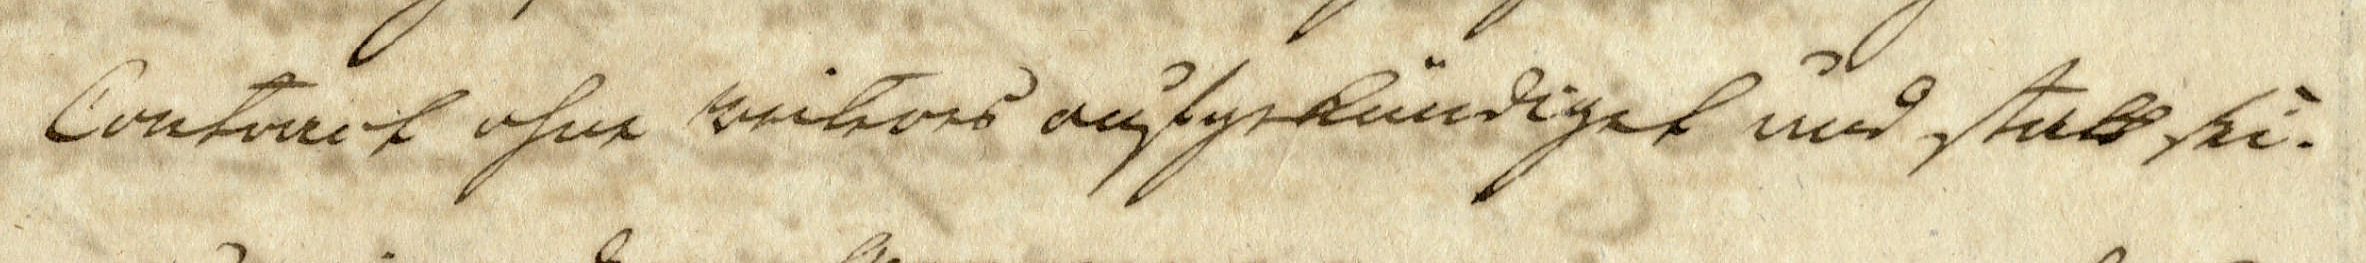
Contract ohne weiteres aufgekündiget und statt sei¬
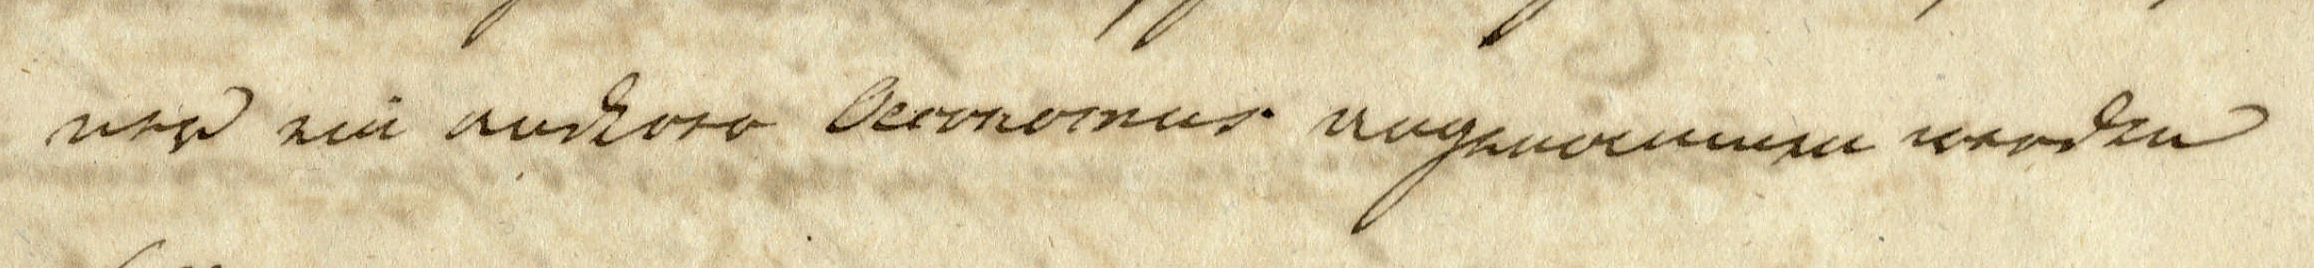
ner ein anderer Oeconomus angenommen werden
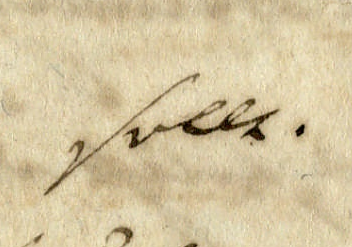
solle.
